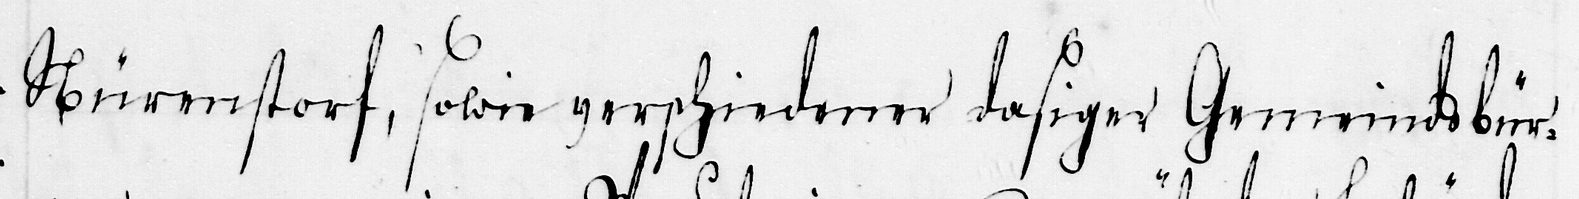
Nürenstorf, sowie verschiedener dasiger Gemeindsbür¬
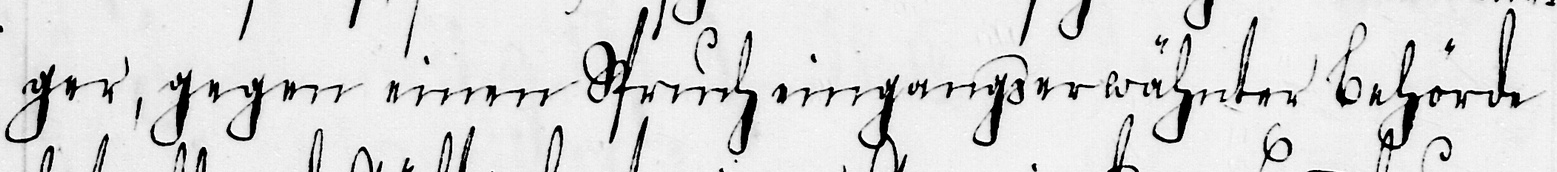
ger, gegen einen Spruch eingangserwähnter Behörde
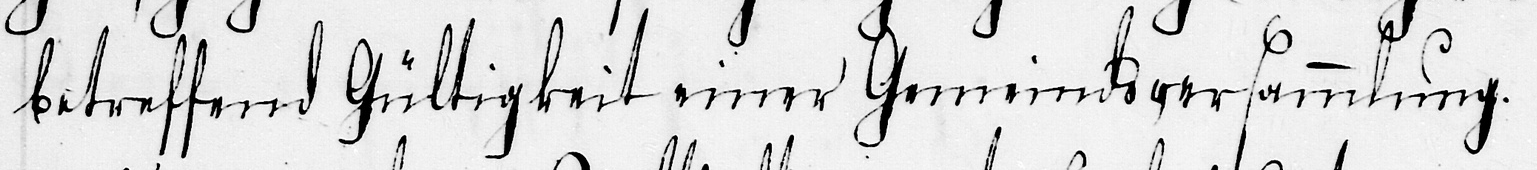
betreffend Gültigkeit einer Gemeindsversammlung.
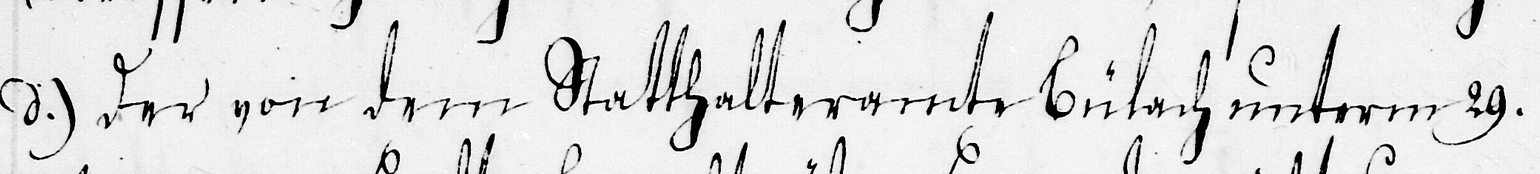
d.) Der von dem Statthalteramte Bülach unterm 29.
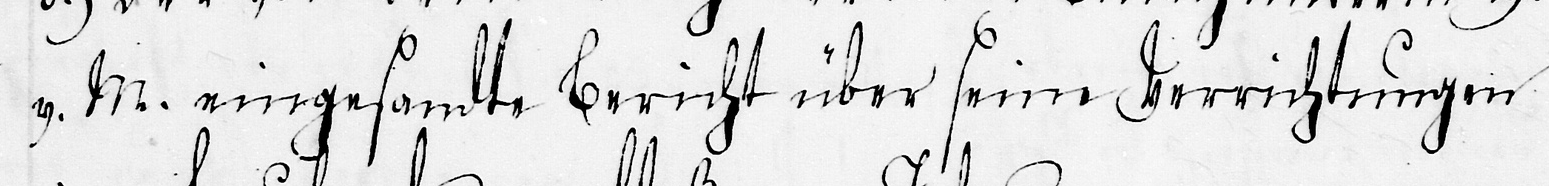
v. M. eingesandte Bericht über seine Verrichtungen
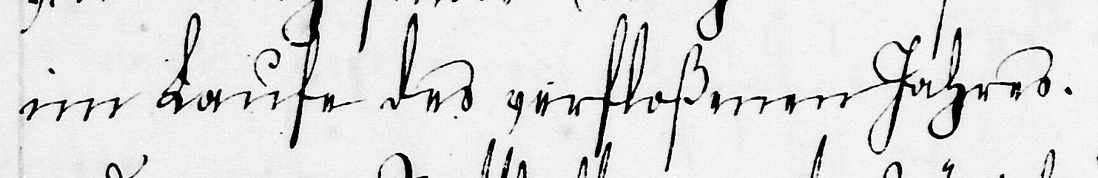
im Laufe des verfloßenen Jahres.
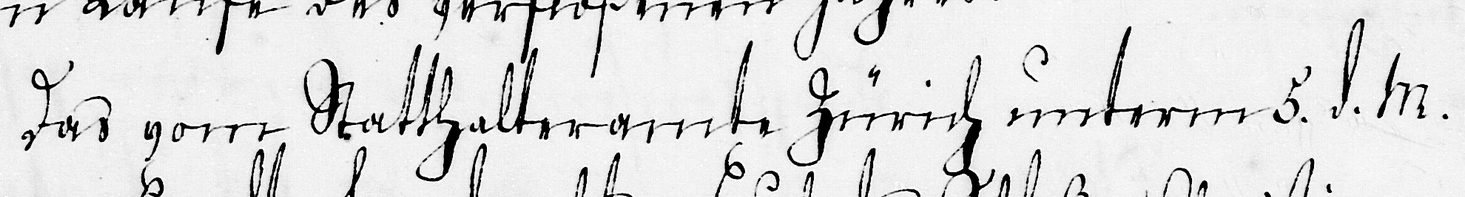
Das vom Statthalteramte Zürich unterm 5. d. M.
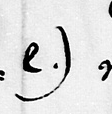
1.)
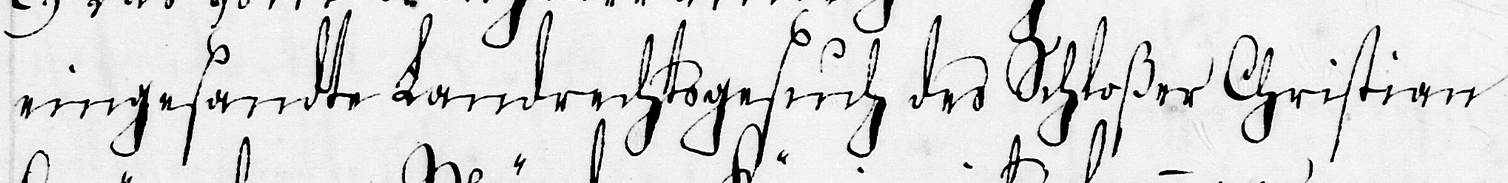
eingesandte Landrechtsgesuch des Schloßer Christian
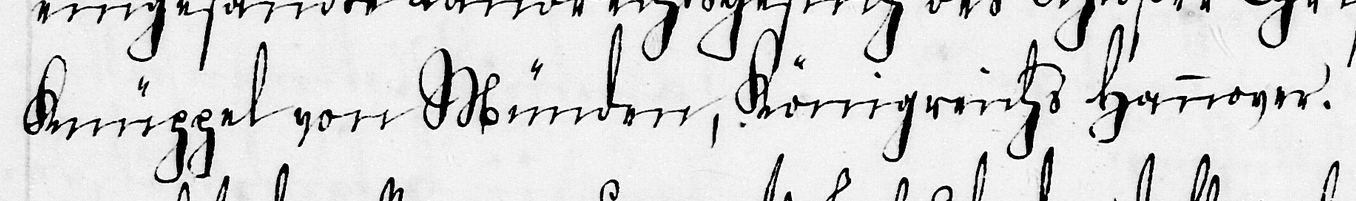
Knüppel von Münden, Königreichs Hannover.
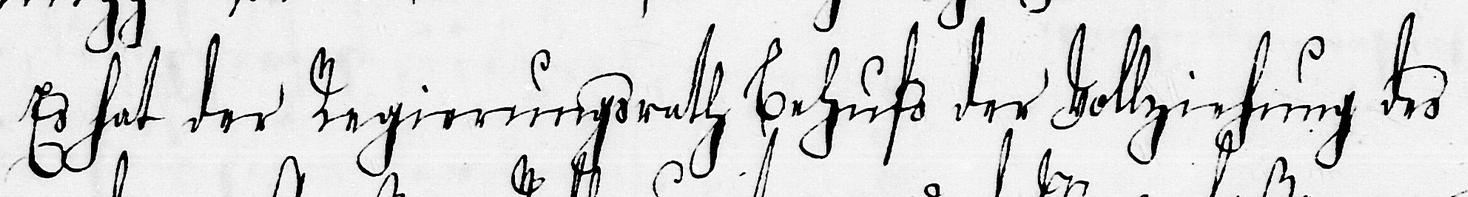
Es hat der Regierungsrath Behufs der Vollziehung des
